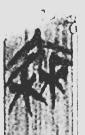秦
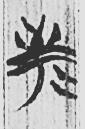{至于}=
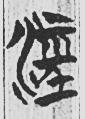涇
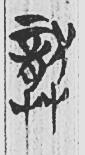{𦚏兄廾}
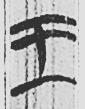王
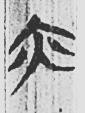亦
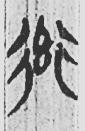率
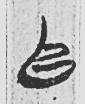𠂤
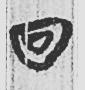回
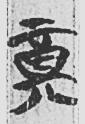奠
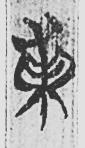{木𦥑}
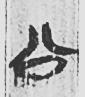公
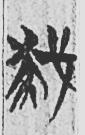{求戈}（救）
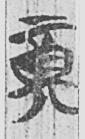奠
